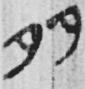多
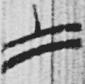士
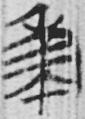秉
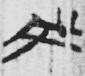吝（文）
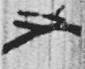之
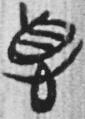惪（德）
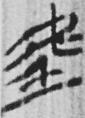○（吾）
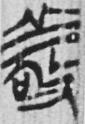敬
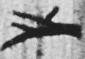之
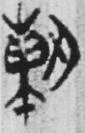剌（烈）
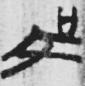吝（文）
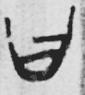曰
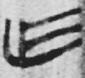乍〈亡〉
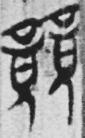競
